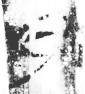月
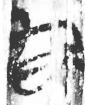旬
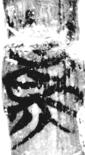○（爨）
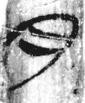月
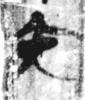內（入）
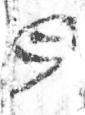月
